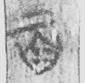百
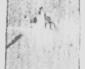六
